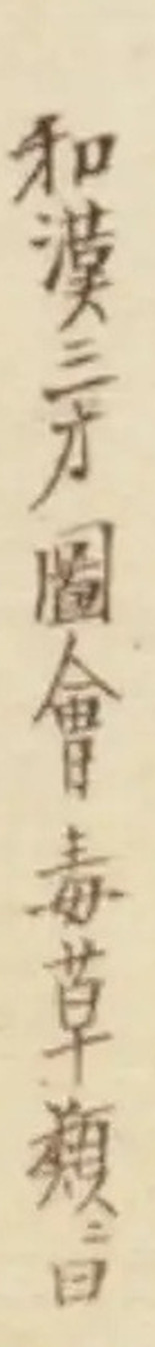和漢三才圖會毒草類ニ曰
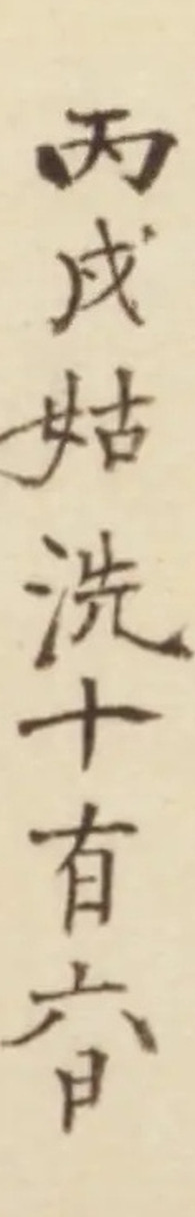丙戌姑洗十有六日
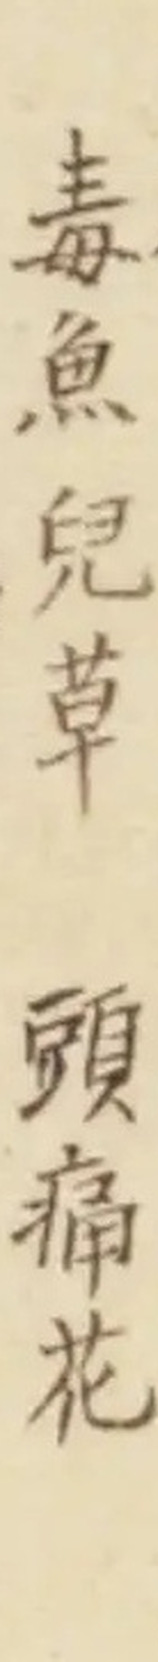毒魚兒草頭痛花
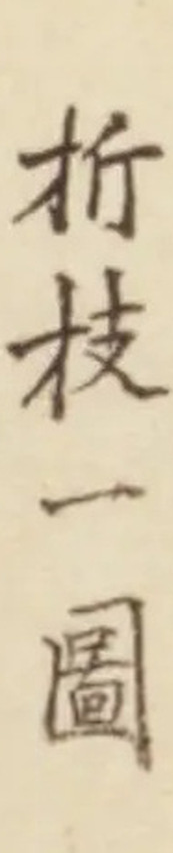折枝一圖
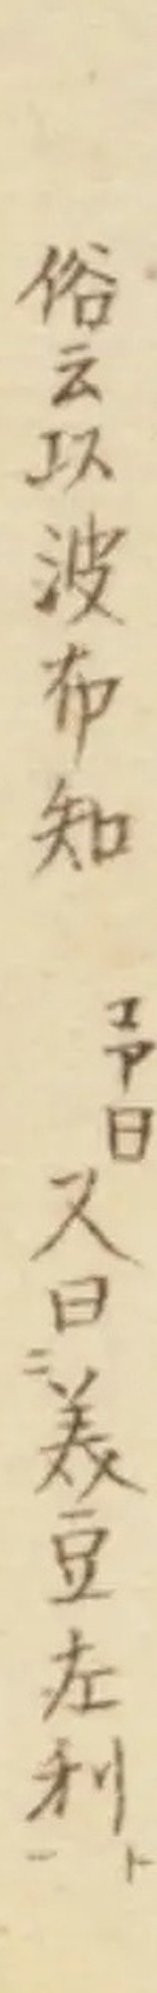俗云以波布地予曰又曰美豆左利ト

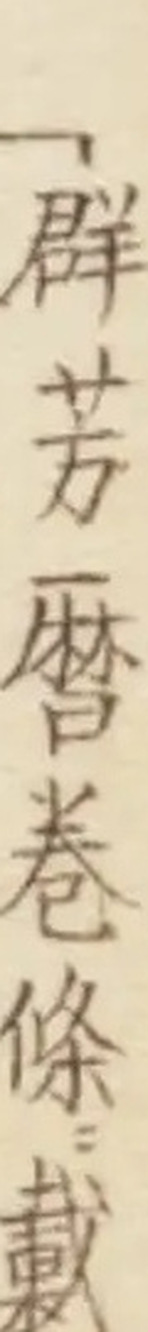群芳暦巻條に載
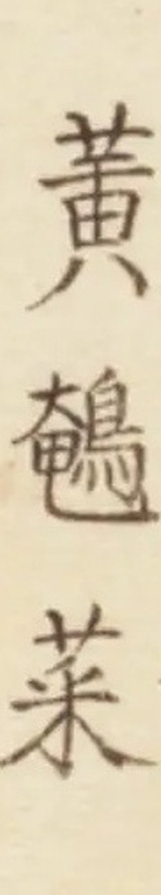黄鵪菜
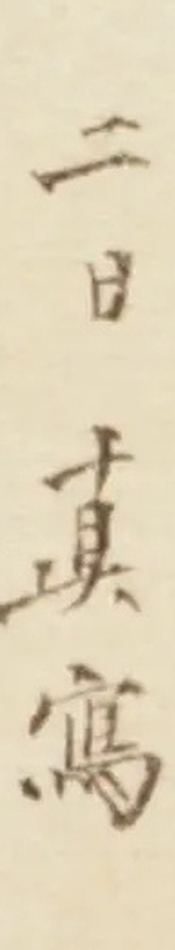二日真寫

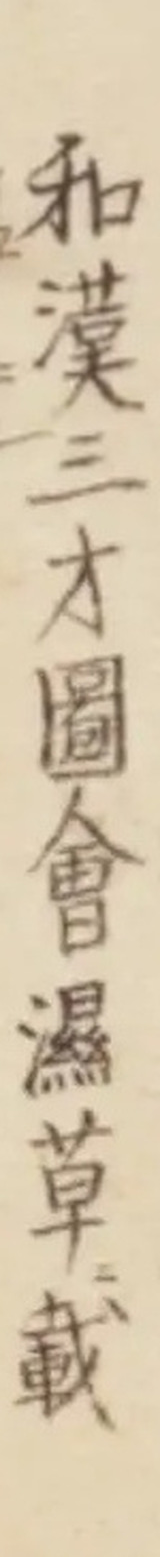和漢三才圖會濕草ニ載
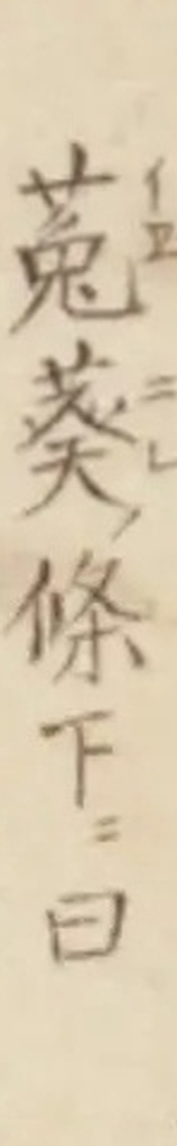菟葵ノ條下ニ曰
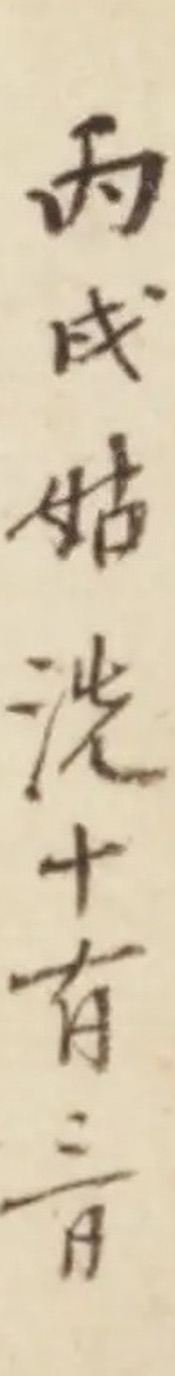丙戌姑洗十中三日
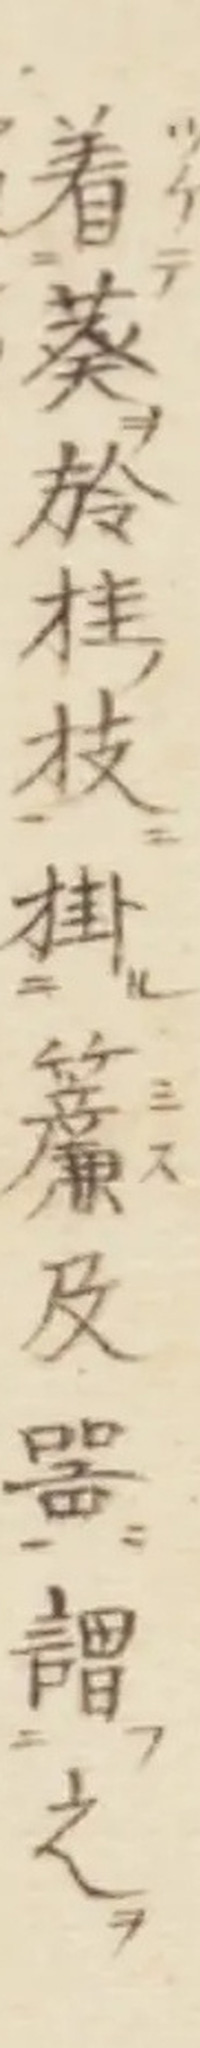着テ葵ヲ於桂ノ枝にニ掛ル簾及器ニ謂フ之ヲ
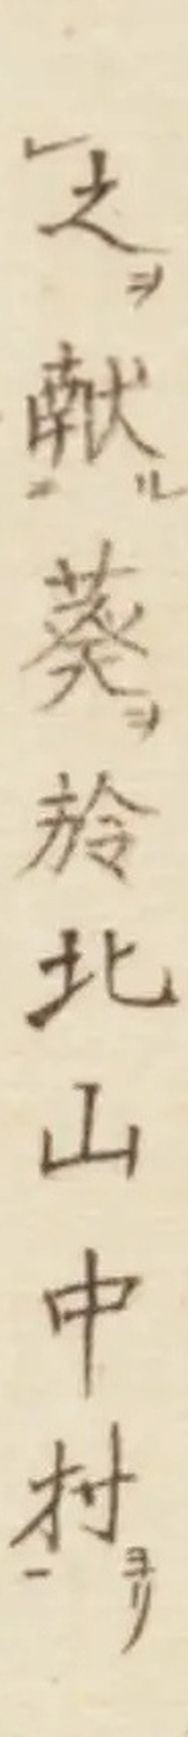之ヲ献ル葵ヲ於北山中村ヨリ
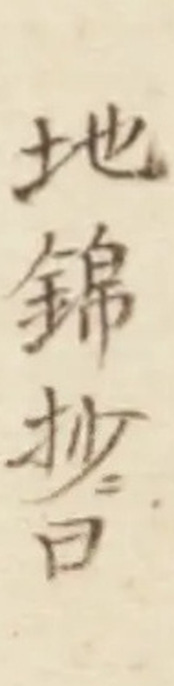地錦抄ニ曰
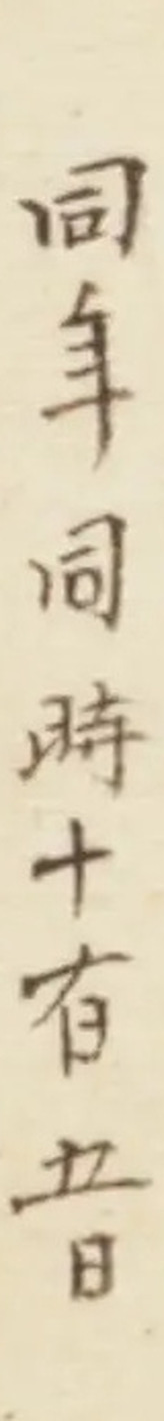同年同時十中五日
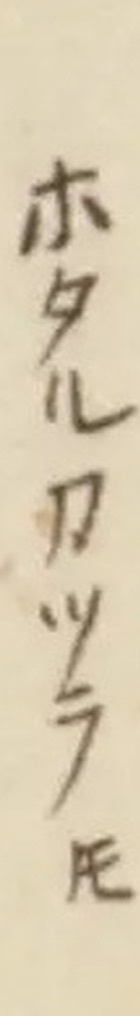ホタルカツラ共
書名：梅園草木花譜春之部. 3
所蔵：国立国会図書館 National Diet Library, JAPAN
